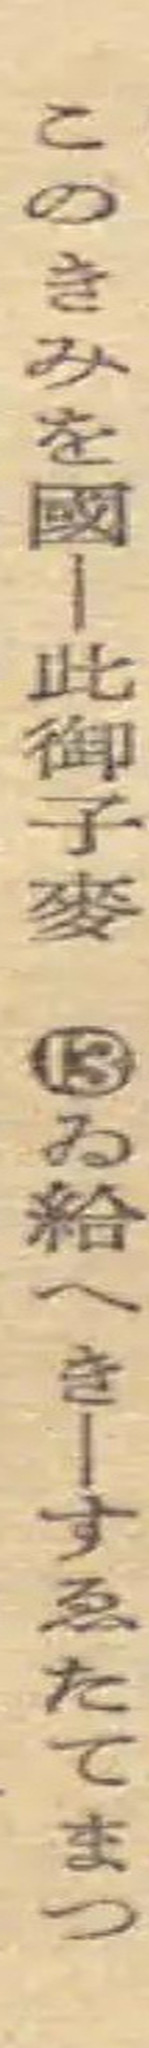このきみを国―此御子麦⓭ゐ給へき―すゑたてまつ
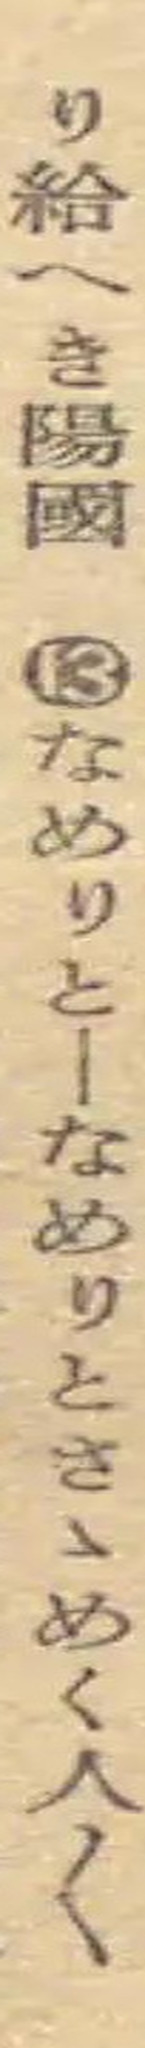り給へき陽国⓭なめりと―なめりとさゝめく人〳〵
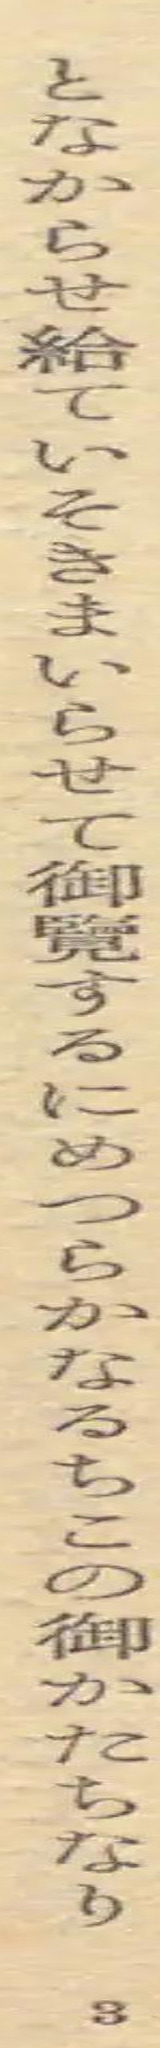となからせ給ていそきまいらせて御覧するにめつらかなるちこの御かたちなり
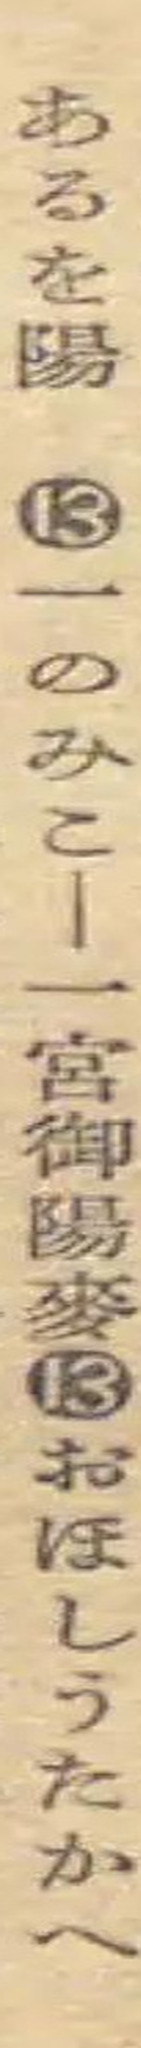あるを陽⓭一のみこ―一宮御陽麦⓭おほしうたかへ
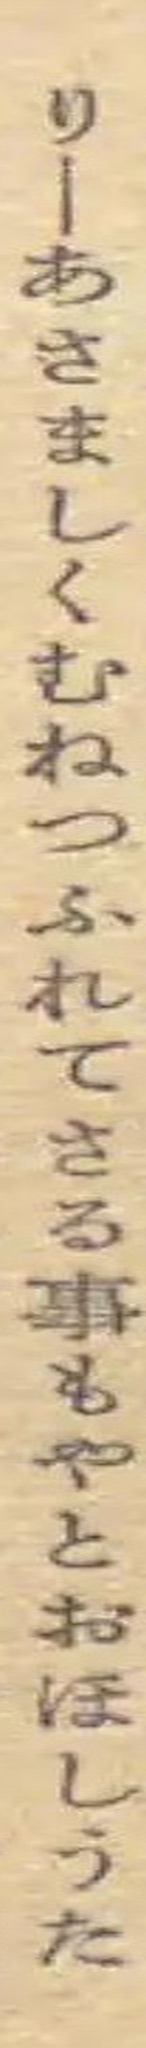り―あさましくむねつふれてさる事もやとおほしうた
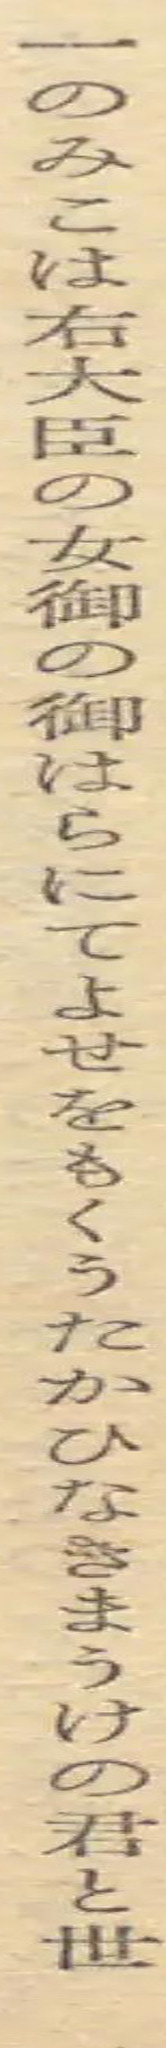一のみこは右大臣の女御の御はらにてよせをもくうたかひなきまうけの君と世
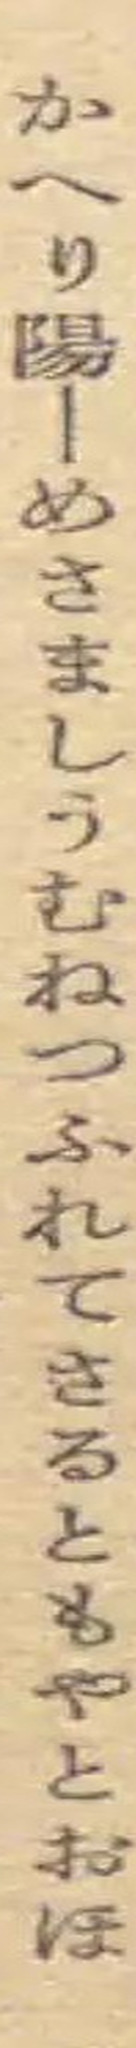かへり陽―めさましうむねつふれてさるともやとおほ
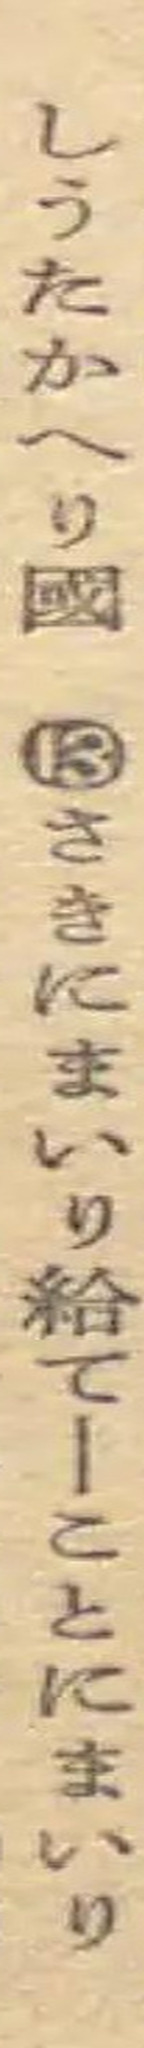しうたかへり国⓭さきにまいり給て―ことにまいり
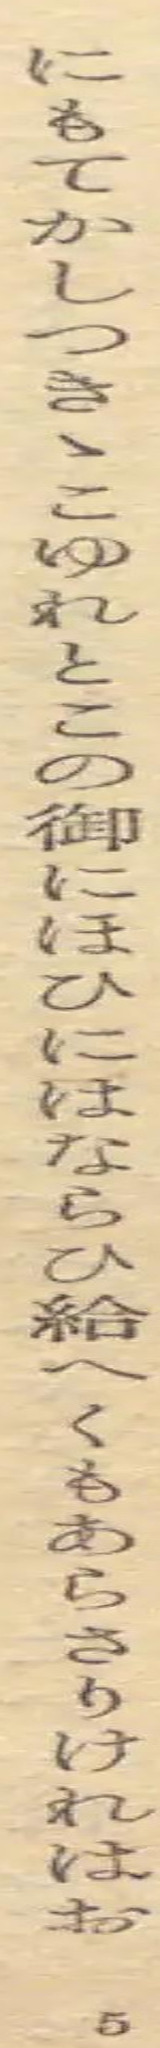にもてかしつきゝこゆれとこの御にほひにはならひ給へくもあらさりけれはお
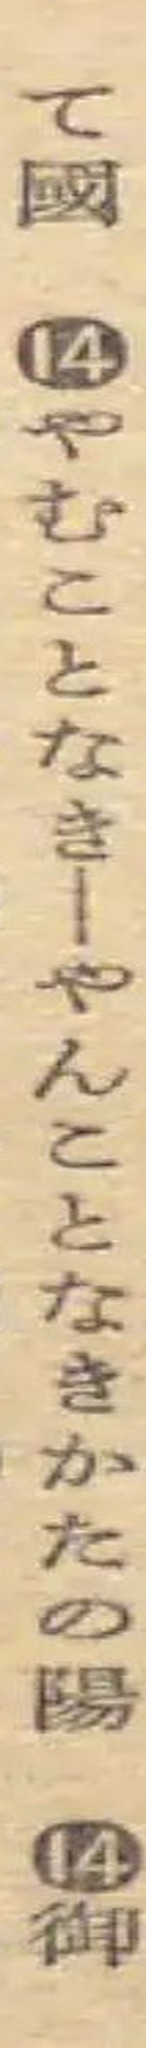て国⓮やむことなき―やんことなきかたの陽⓮御
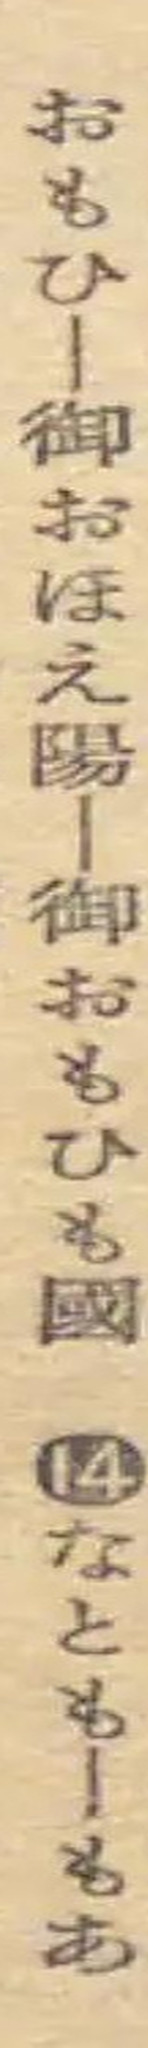おもひ―御おほえ陽―御おもひも国⓮なとも―もあ
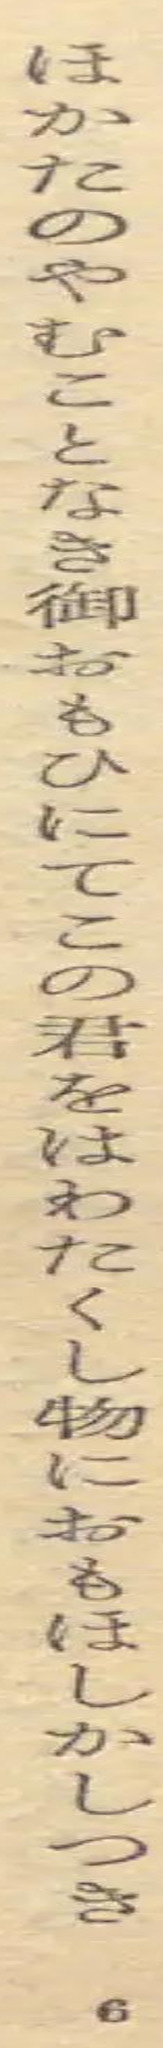ほかたのやむことなき御おもひにてこの君をはわたくし物におもほしかしつき
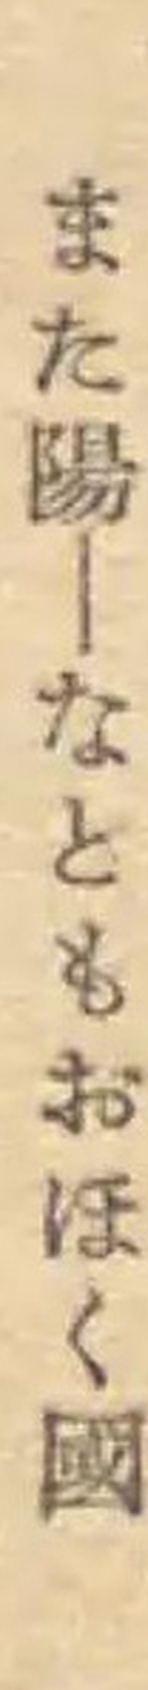また陽―なともおほく国
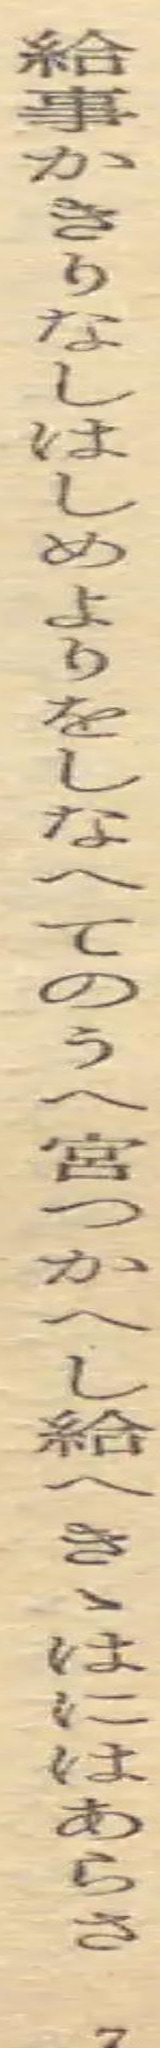給事かきりなしはしめよりをしなへてのうへ宮つかへし給へきゝはにはあらさ
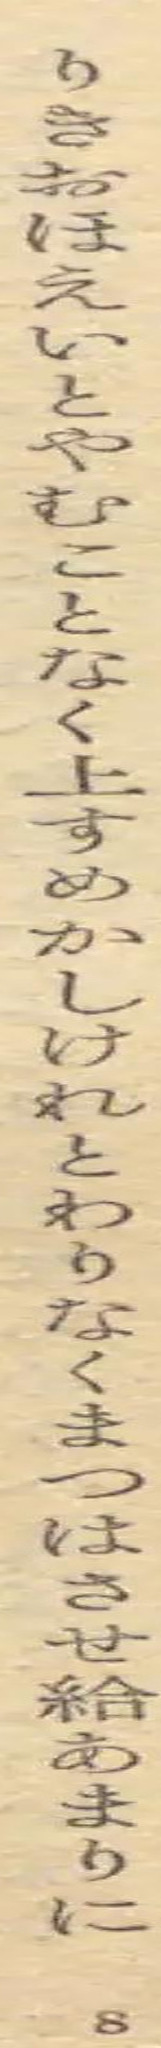りきおほえいとやむことなく上すめかしけれとわりなくまつはさせ給あまりに
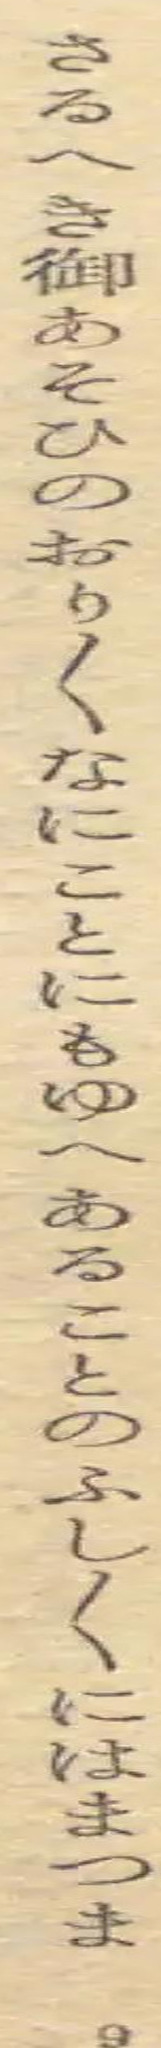さるへき御あそひのおり〳〵なにことにもゆへあることのふし〳〵にはまつま
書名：校異源氏物語.
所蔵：国立国会図書館 National Diet Library, JAPAN
